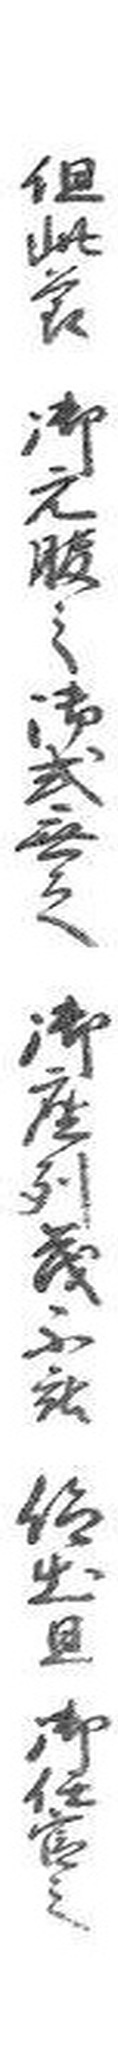但此節御元服之御式無之御座列茂不被仰出且御任官之
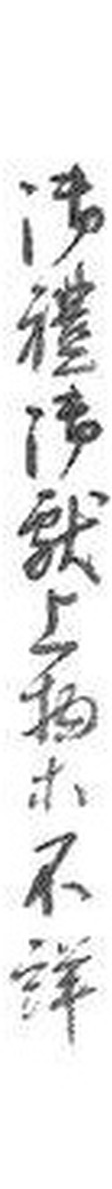御礼御献上物等不詳
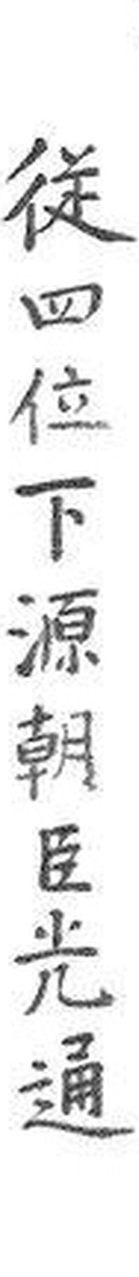従四位下源朝臣光通
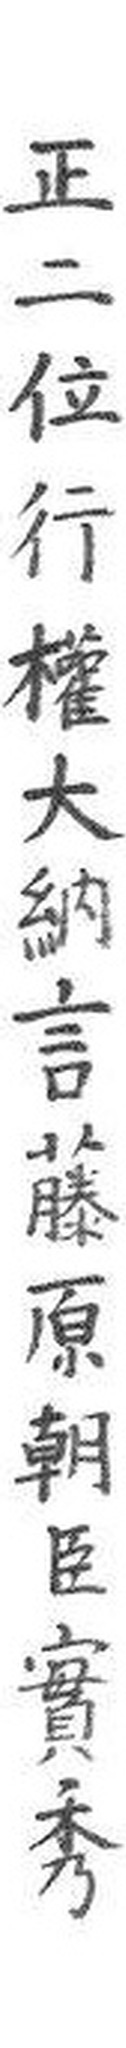正二位行権大納言藤原朝臣實秀
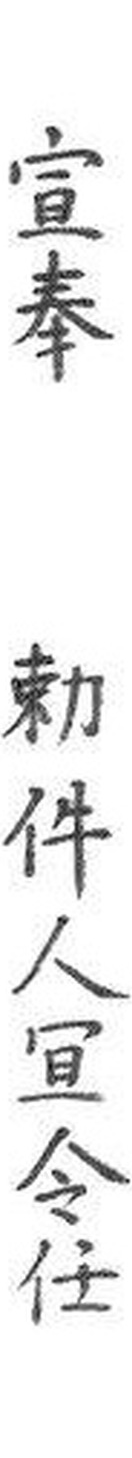宣奉勅件人宜令任
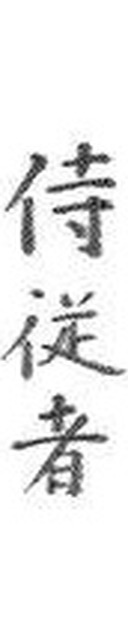侍従者
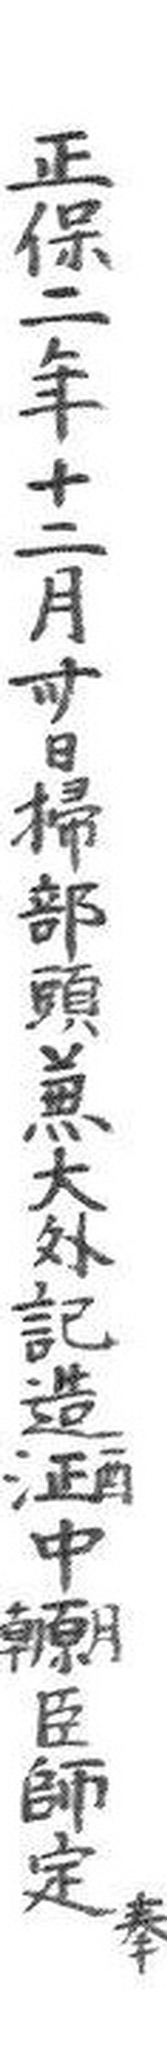正保二年十二月卅日掃部頭兼大外記造酒中原朝臣師定奉
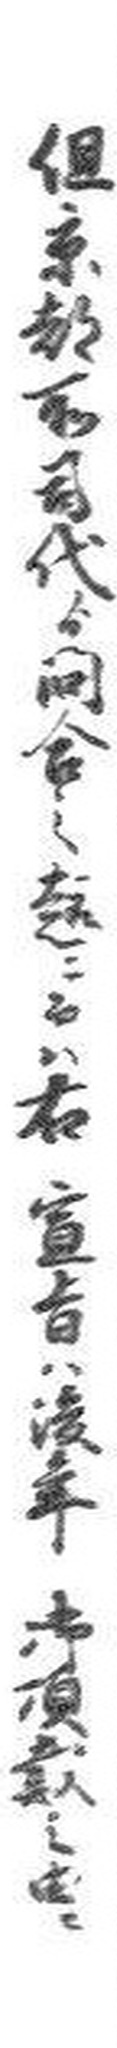但京都所司代ゟ問合之趣ニ而ハ右宣旨ハ後年御頂戴之由ニ
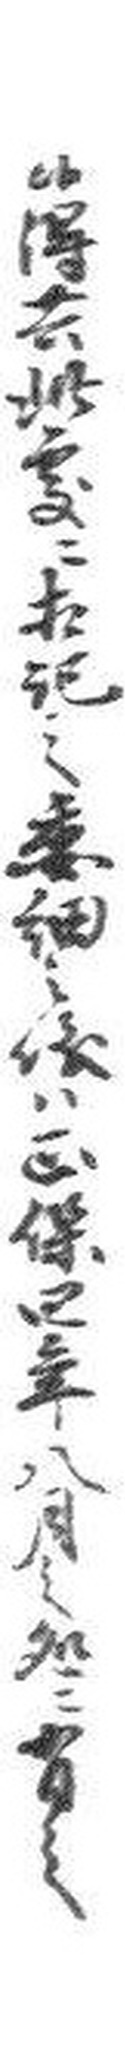候得共此処ニ相記之委細之儀ハ正保四年八月之処ニ有之
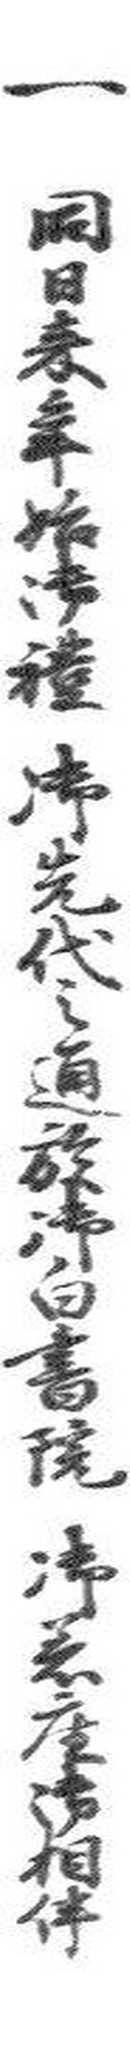一同日来年始御礼御先代之通於御白書院御着座御相伴
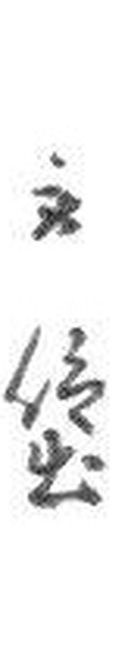被仰出
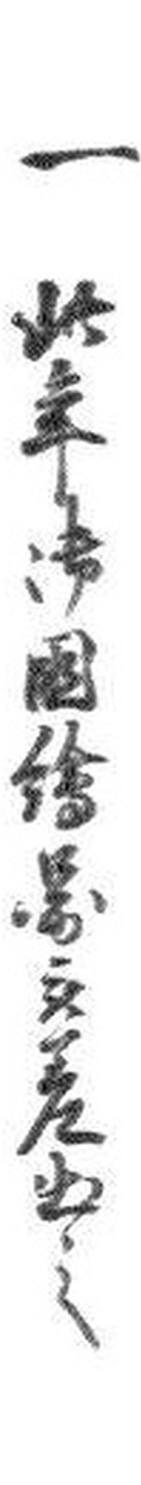一此年御国絵図被差出之
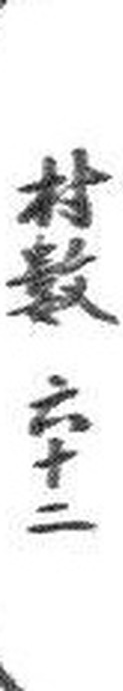村数六十二

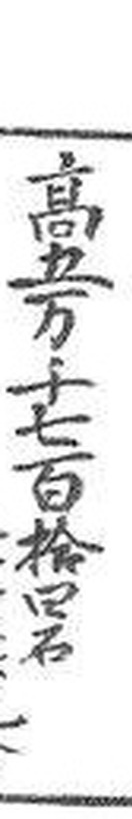高壱万五千弐百拾五石
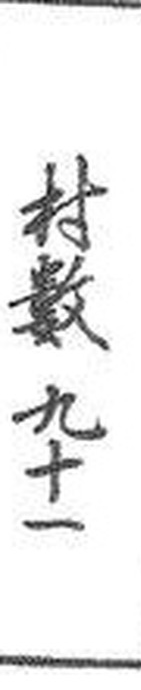村数六十二
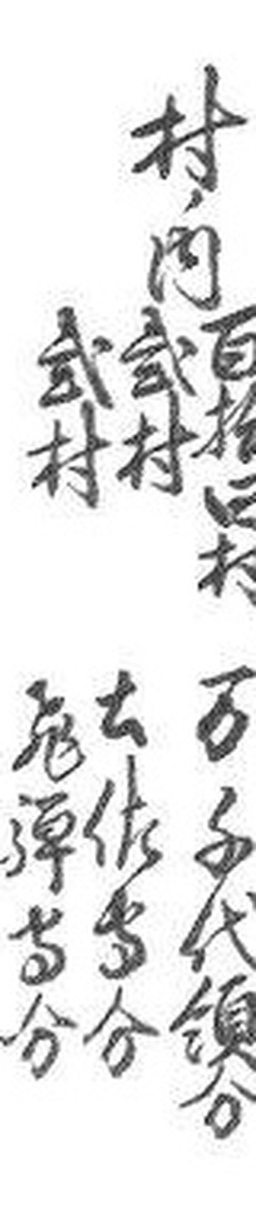弐村飛騨守分
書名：家譜 五 光通公 従寛永十三年到万治二年
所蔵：福井県文書館 Fukui Prefectural Archives
